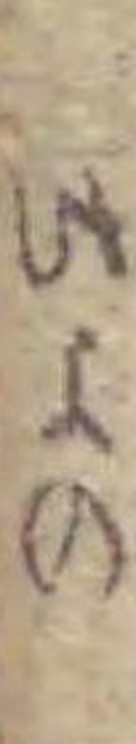此よの
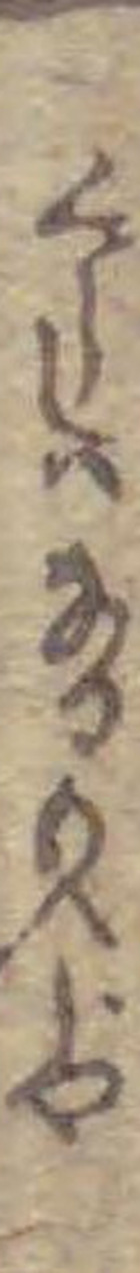くらしはなるもんじや
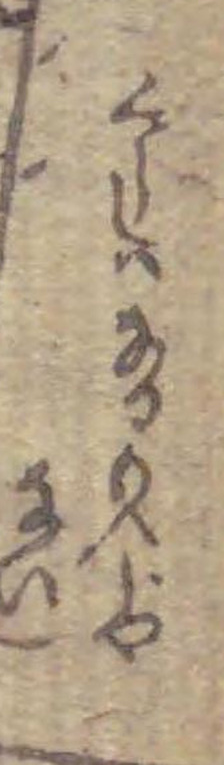くらしはなるもんじや
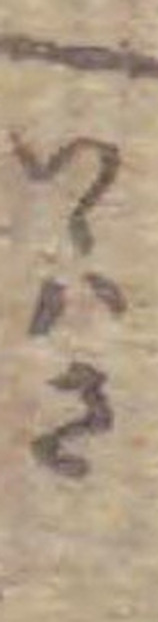いゝはさ
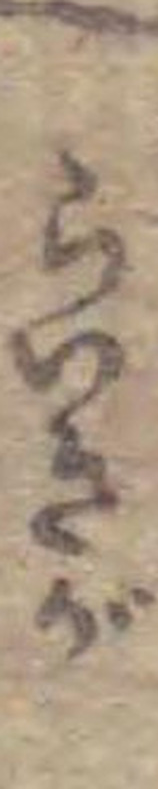らいきが
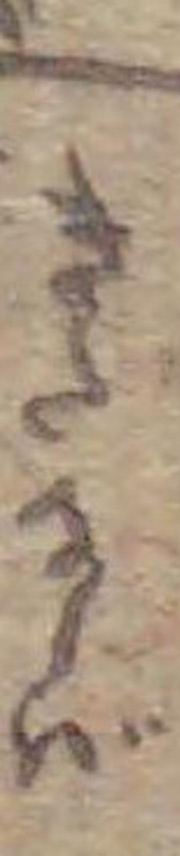きたならば
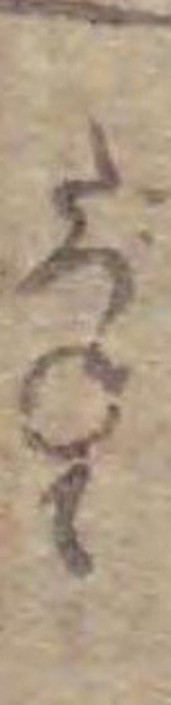たつねて
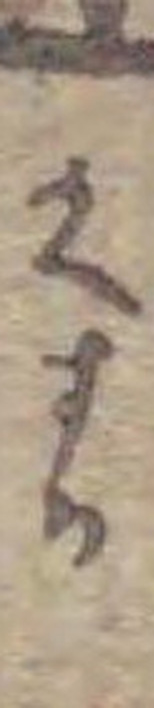かへすか
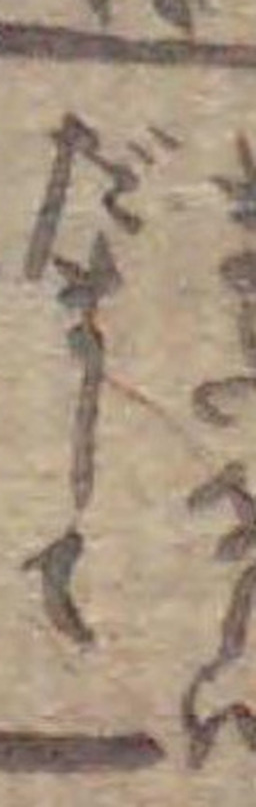だまして
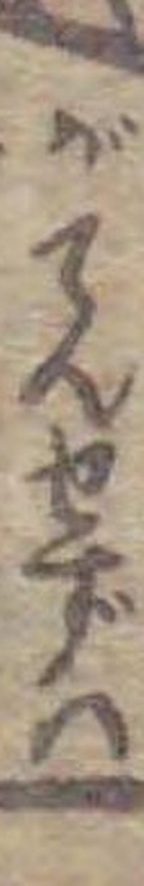がてんせずは
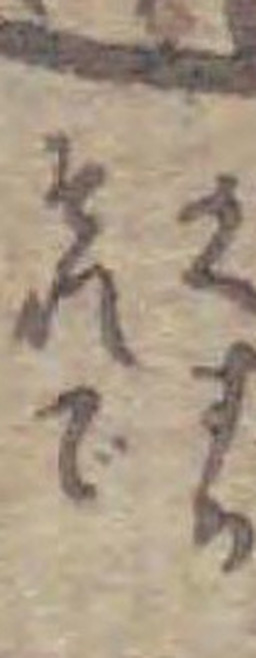それで
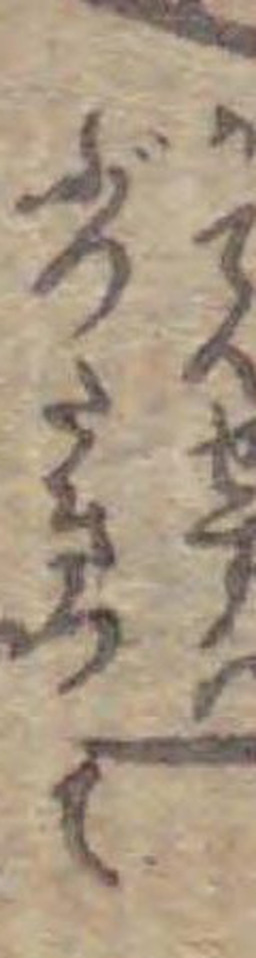ぶつたきつて
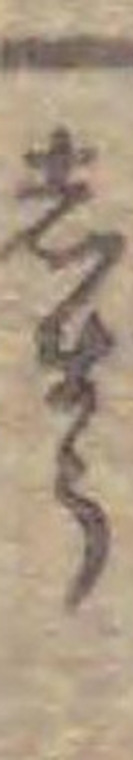しまう
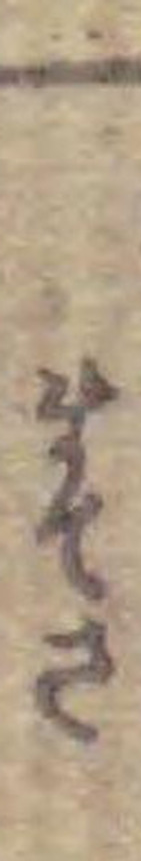まてさ
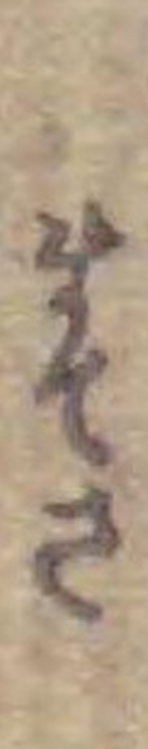まてさ
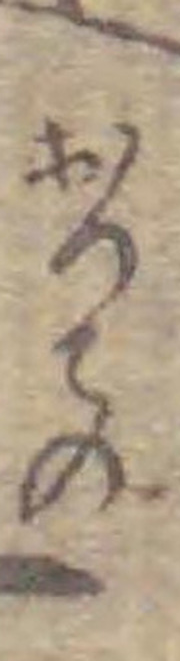おつての
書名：芸者呼子鳥 : 2巻（松泉堂）
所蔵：国立国会図書館 National Diet Library, JAPAN
